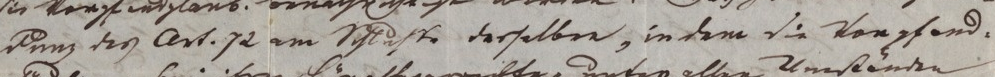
dung des Art. 72 am Schlusse desselben «in dem die Vorpfand-
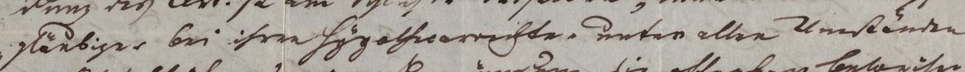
gläubiger bei ihren Hypothekarrechten unter allen Umständen
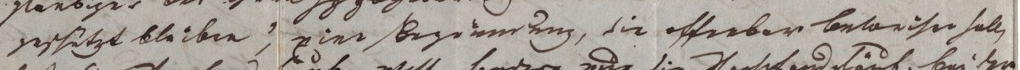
geschützt bleiben» eine Begründung, die offenbar beweisen soll,
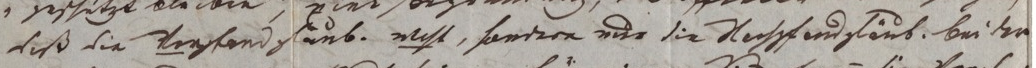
daß die Vorpfandgläub. nicht, sondern nur die Nachpfandgläub. bei der
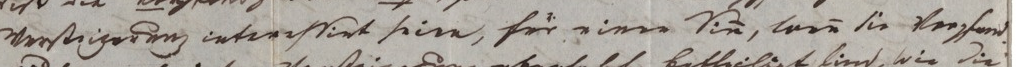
Versteigerung interessirt seien, für einen Sinn, wenn die Vorpfand-
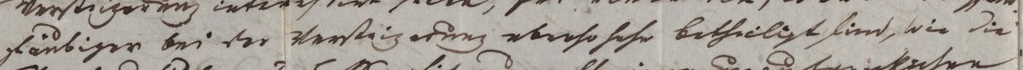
gläubiger bei der Versteigerung ebenso sehr betheiligt sind, wie die
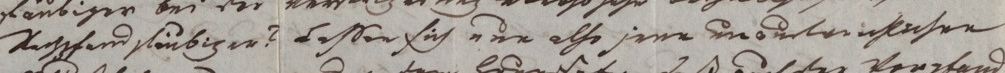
Nachpfangläubiger? Lassen sich nun also jene unausweichlichen
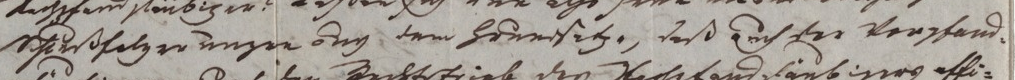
Schlußfolgerungen aus dem Grundsatze, daß auch der Vorpfand-
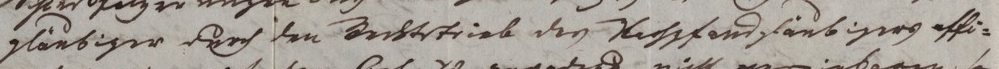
gläubiger durch den Rechtstrieb des Nachpfandgläubigers affi-
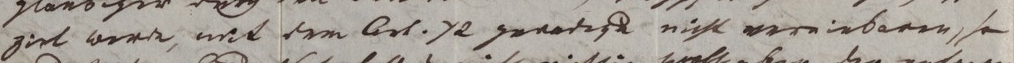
zirt werde, mit dem Art. 72 geradezu nicht vereinbaren, so
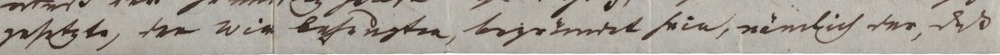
gesetzte, den wir behaupten, begründet sein, nämlich der, daß
